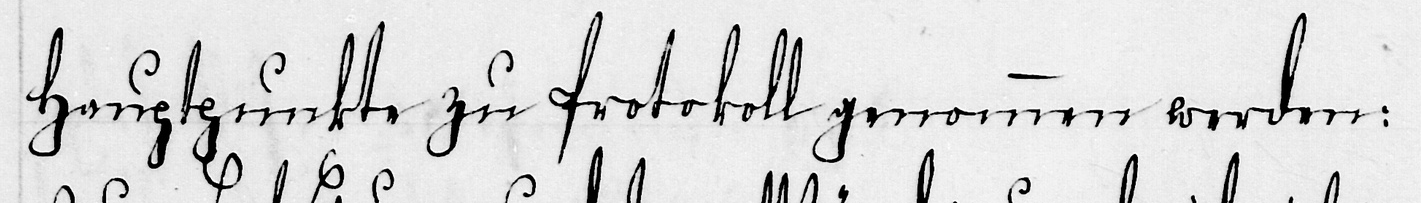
Hauptpunkte zu Protokoll genommen werden:
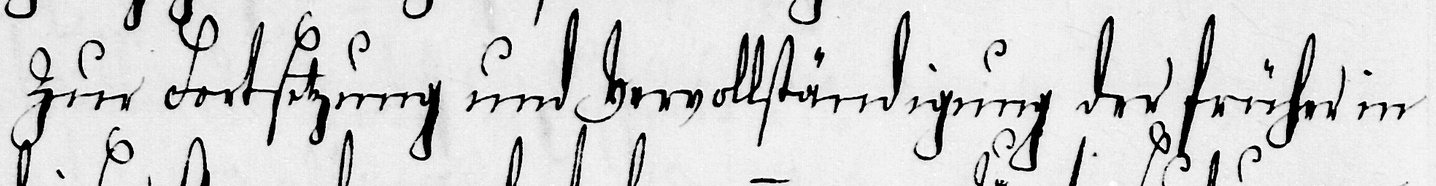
Zur Fortsetzung und Vervollständigung der früher in
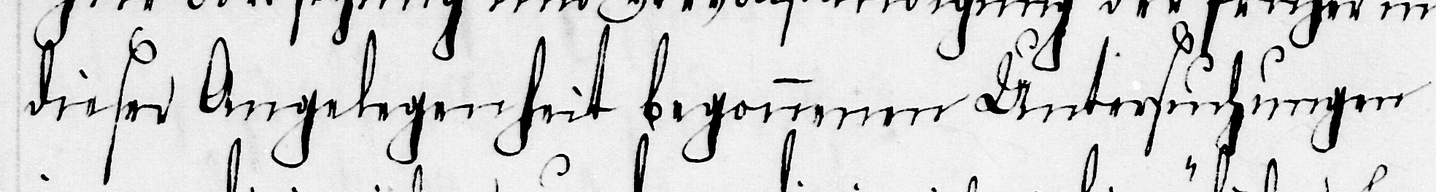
dieser Angelegenheit begonnenen Untersuchungen
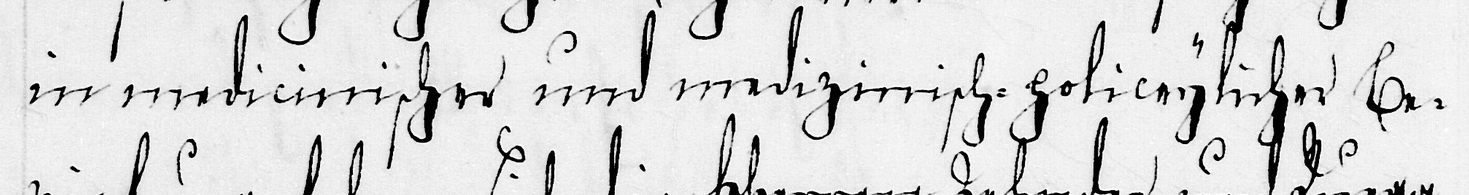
in medicinischer und medizinisch-policeylicher Be¬
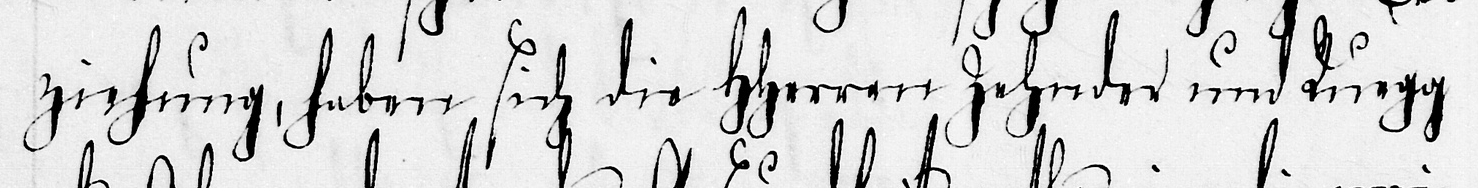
ziehung, haben sich die HHerren Zehnder und Ruegg
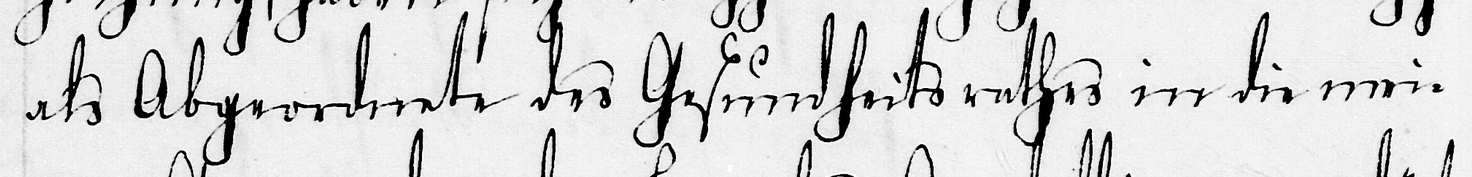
als Abgeordnete des Gesundheitsrathes in die mei¬
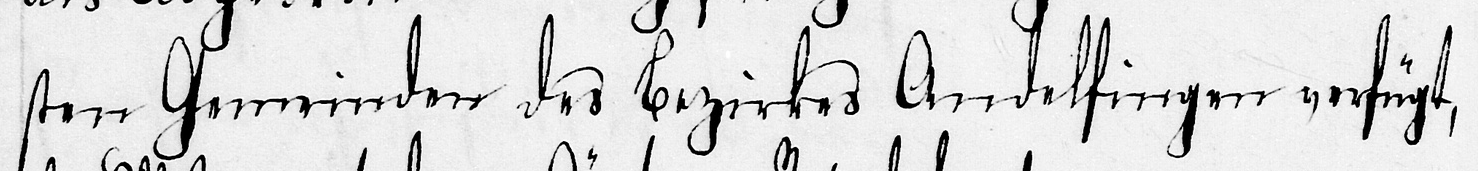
sten Gemeinden des Bezirkes Andelfingen verfügt,
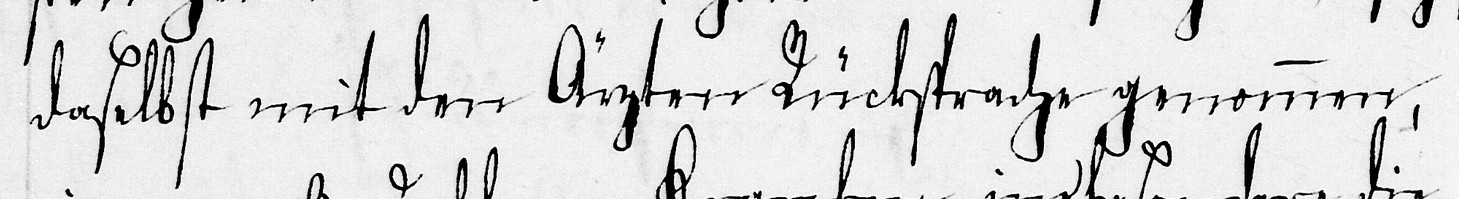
daselbst mit den Ärzten Rücksprache genommen,
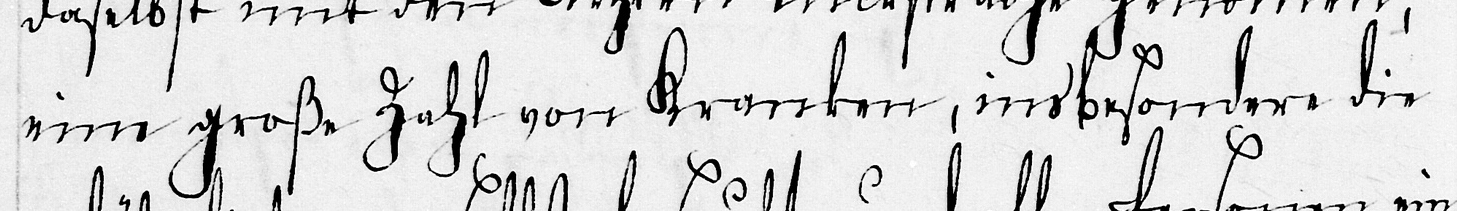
eine große Zahl von Kranken, insbesondere die
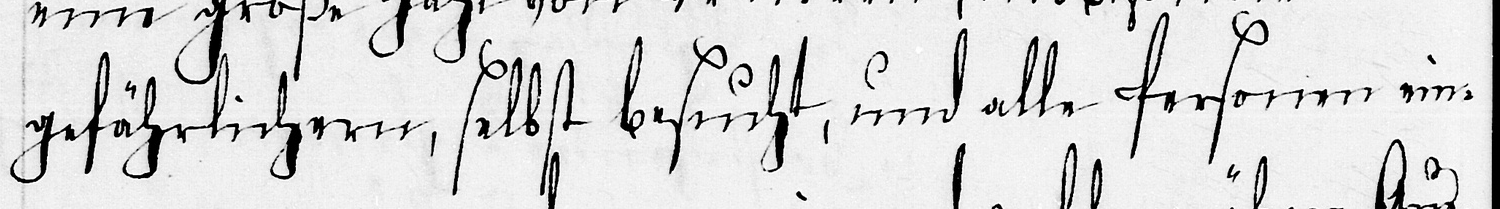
gefährlichern, selbst besucht, und alle Personen ein¬
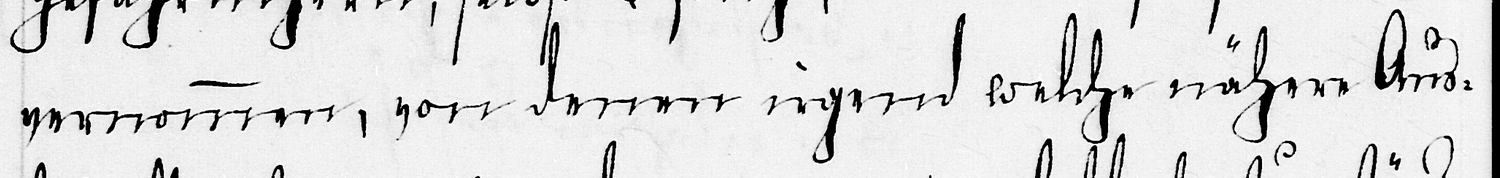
vernommen, von denen irgend welche nähere Aus¬
